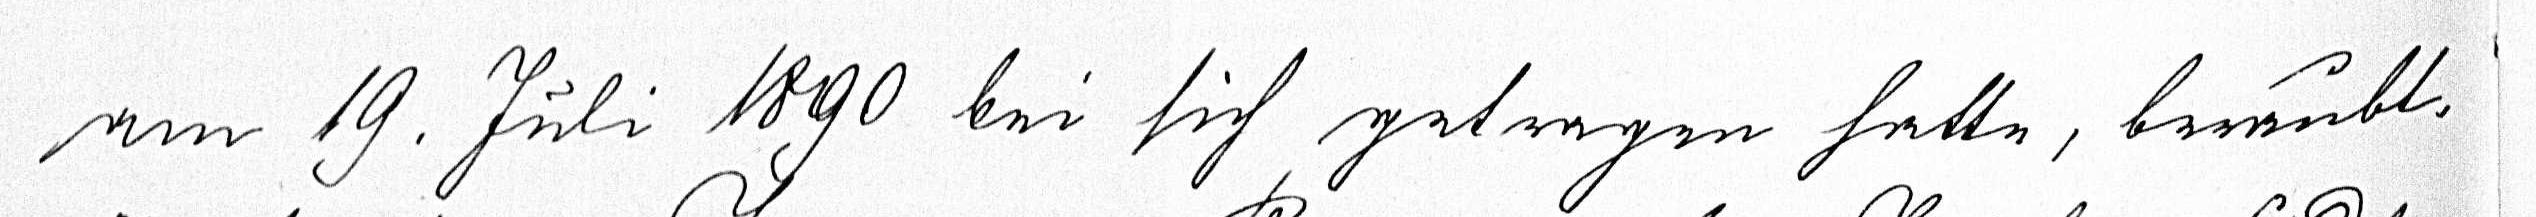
am 19. Juli 1890 bei sich getragen hatte, beraubt.
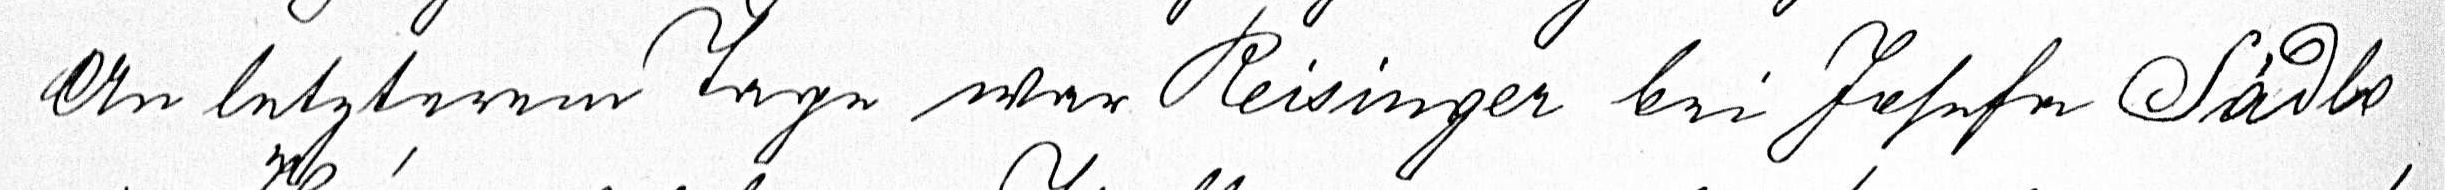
An letzteren Tage war Reisinger bei Josefa Sádbe
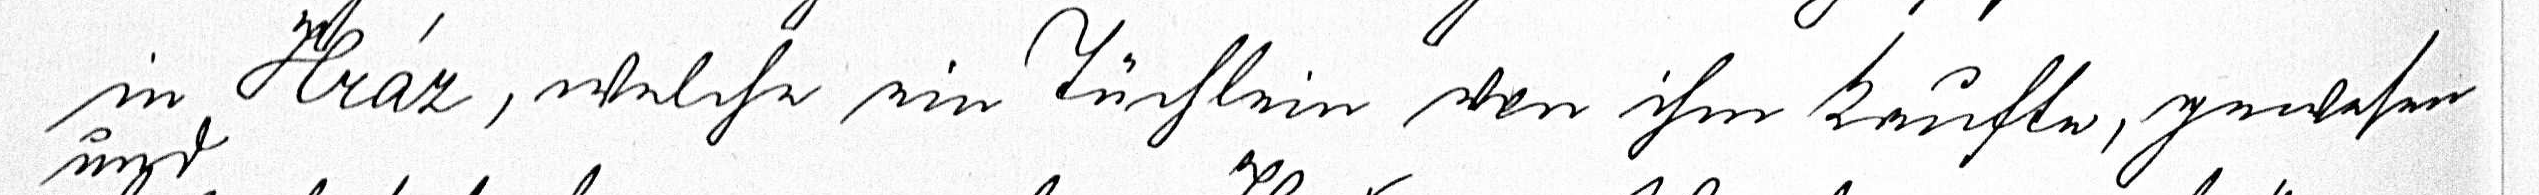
in Hráz, welche ein Tüchlein von ihm kaufte, gewesen
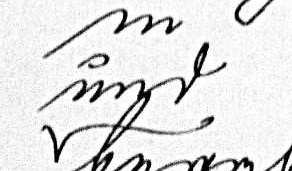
und
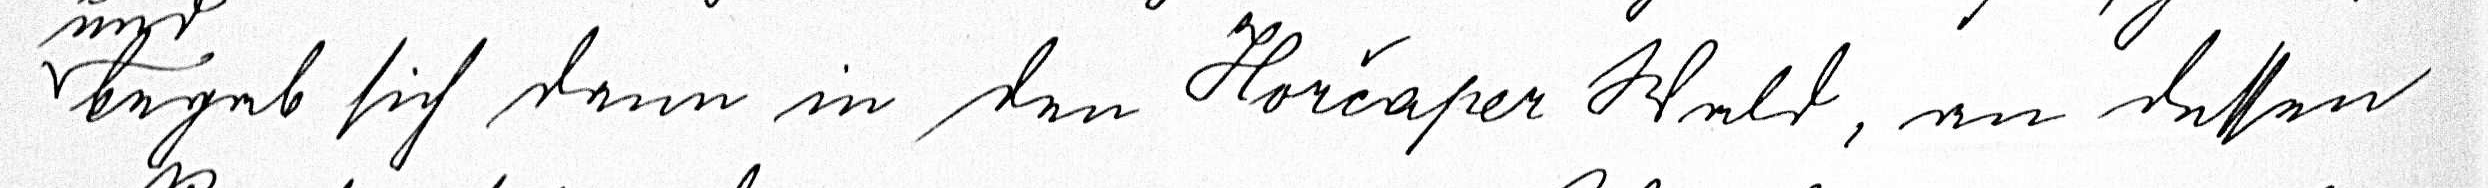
begab sich dann in den Horčaper Wald, an dessen
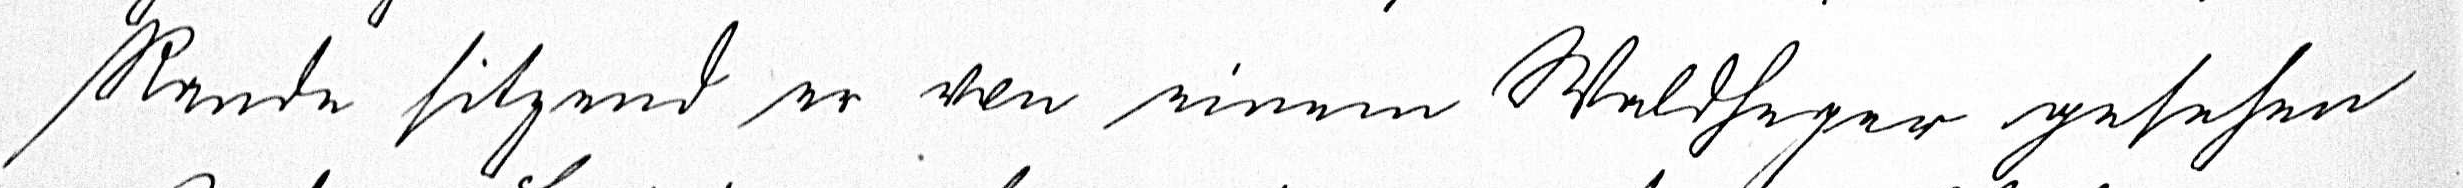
Rande sitzend er von einem Waldheger gesehen
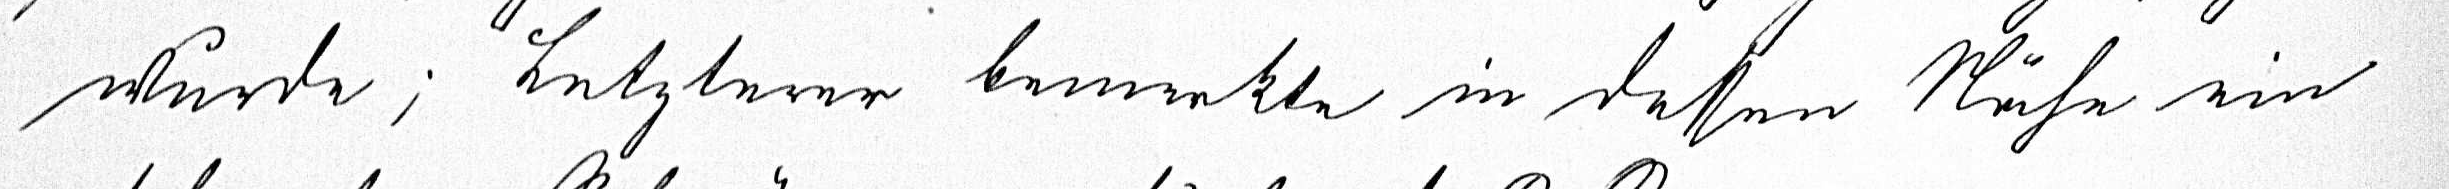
wurde; letzterer bemerkte in dessen Nähe ein
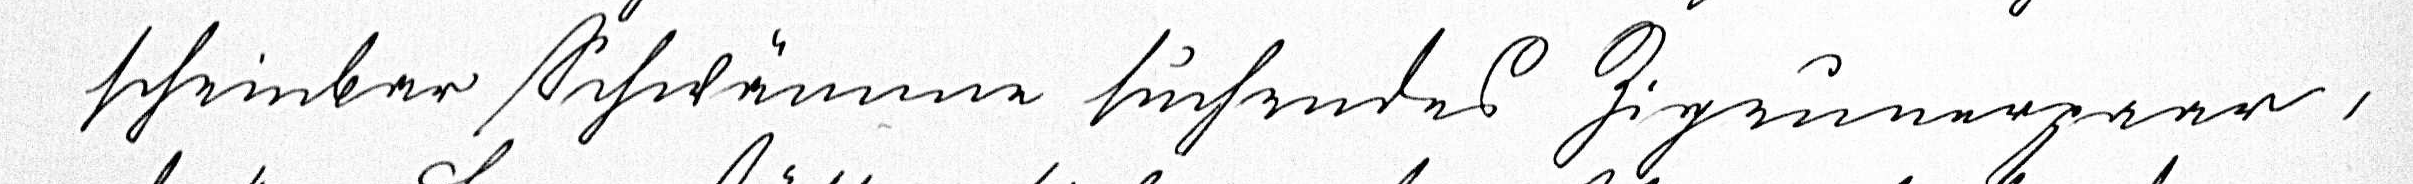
scheinbar Schwämme suchendes Zigeunerpaar,
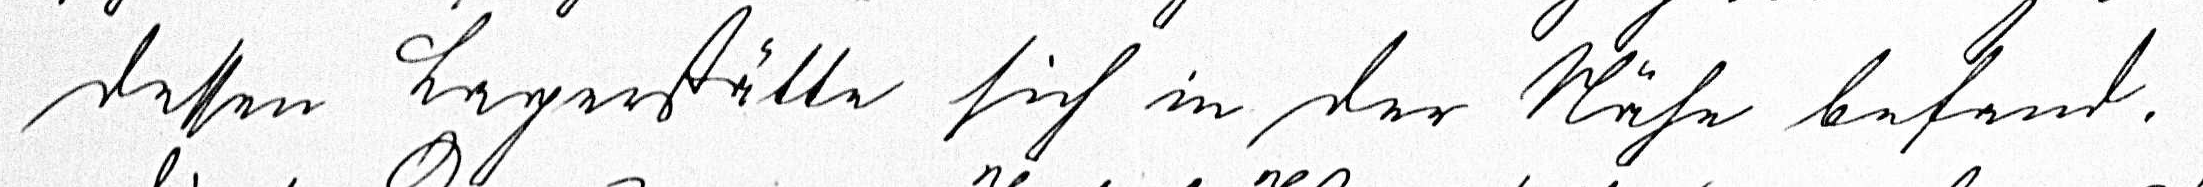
dessen Lagerstätte sich in der Nähe befand.
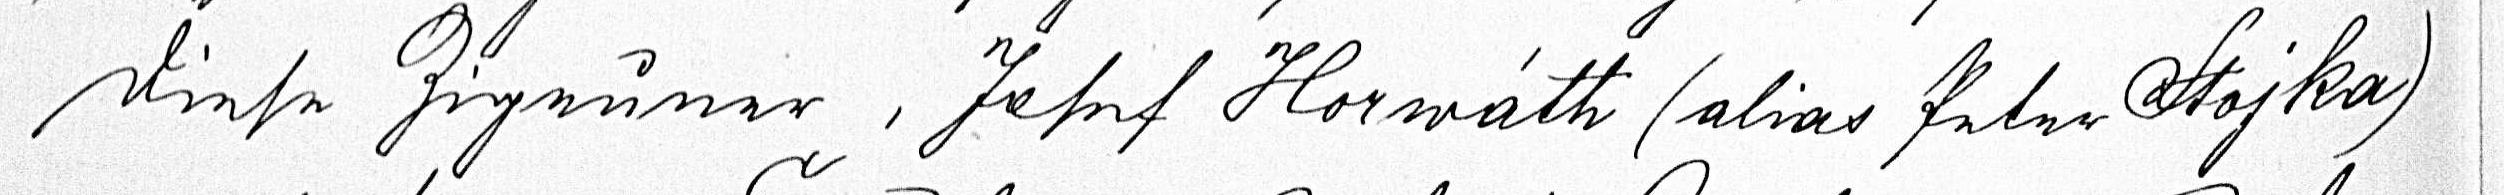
Diese Zigeuner, Josef Horwáth (alias Peter Stojka)
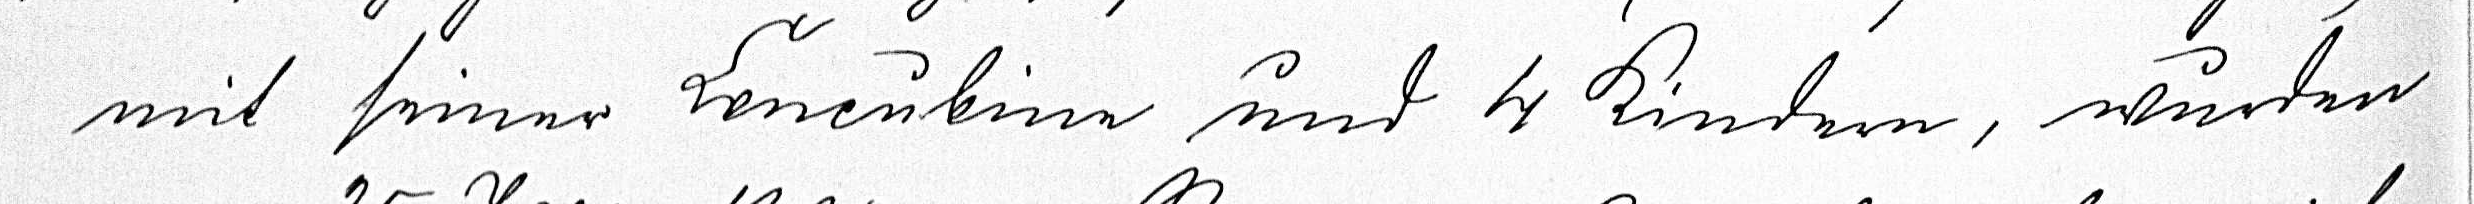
mit seiner Concubin und 4 Kindern, wurden
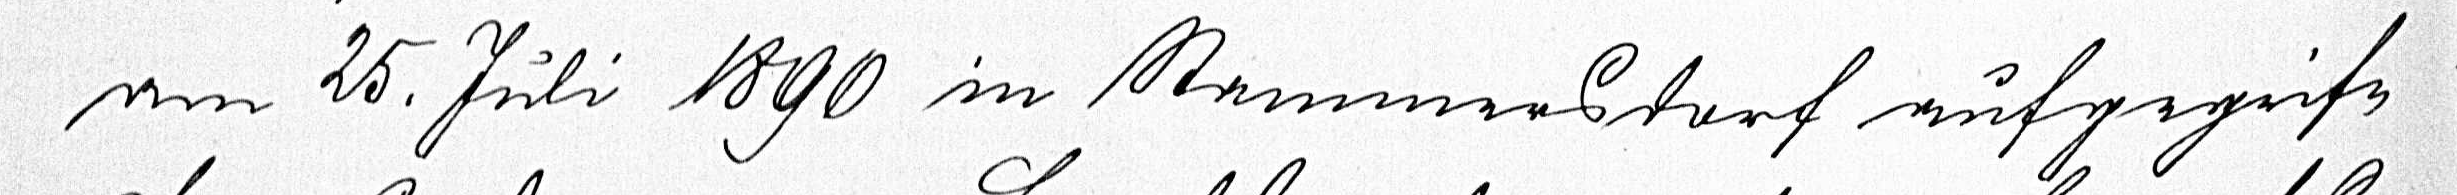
am 25. Juli 1890 in Stammersdorf aufgegrif¬
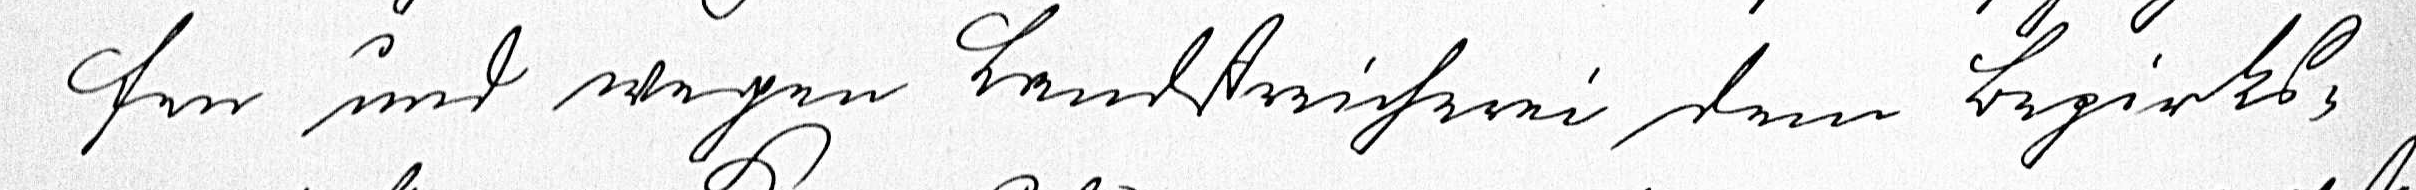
fen und wegen Landstreicherei dem Bezirks¬
